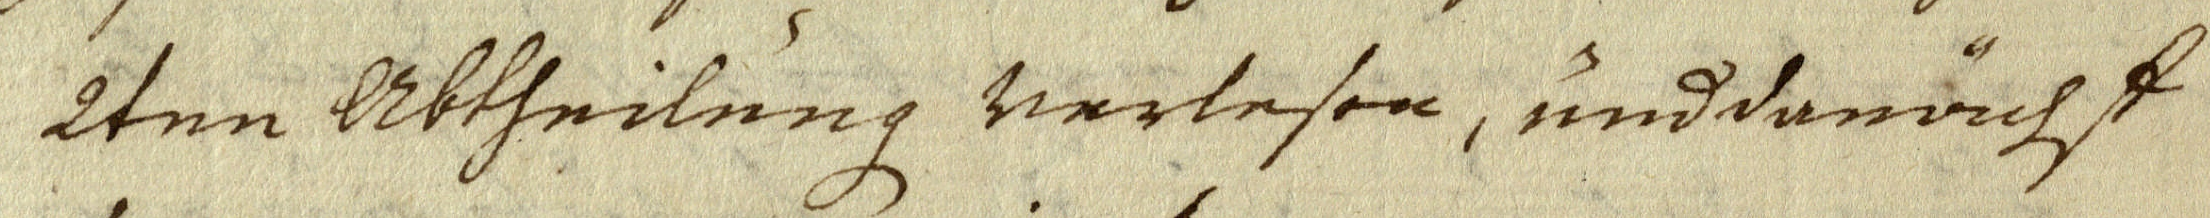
2ten Abtheilung verlesen, und danächst
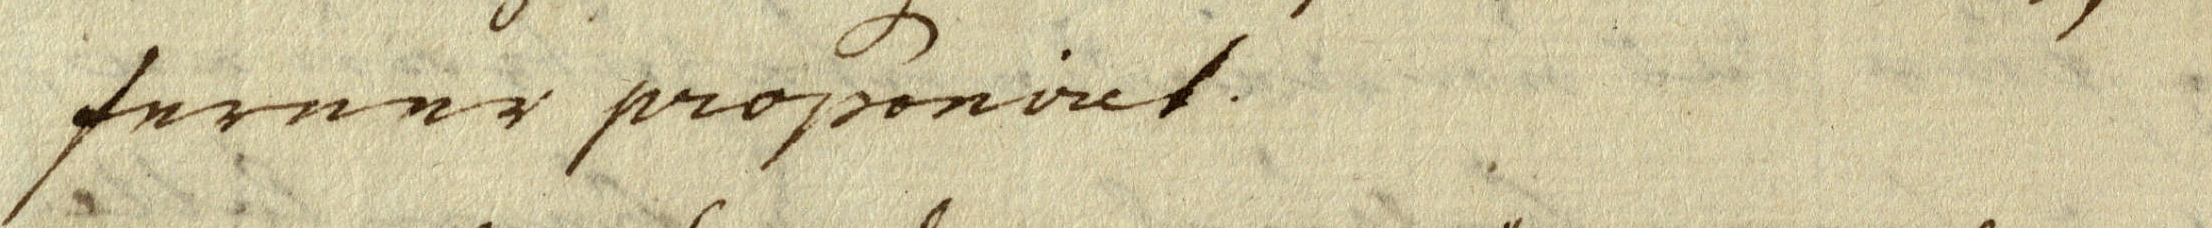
ferner proponiret.
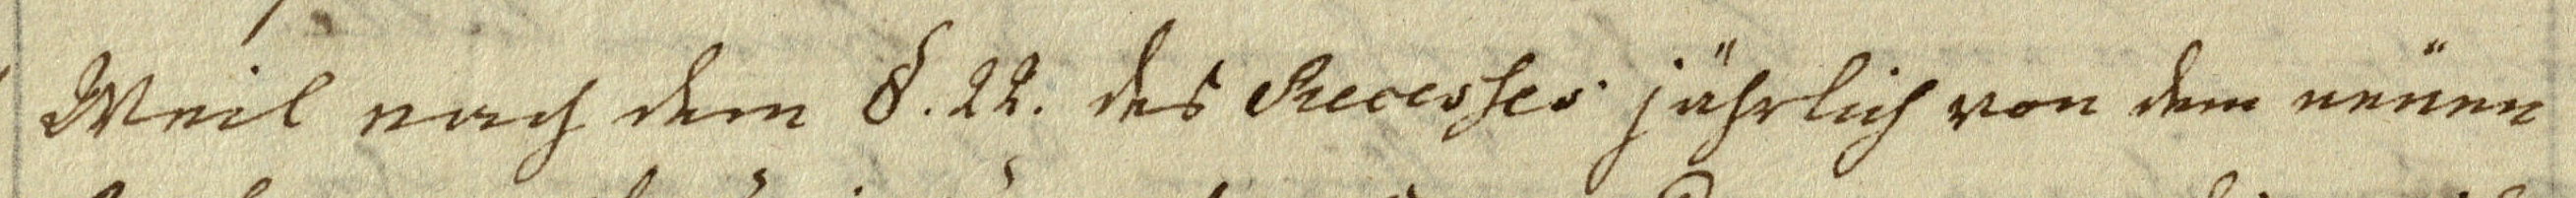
1. Weil nach dem §.22. des Recesses jährlich von dem neuen
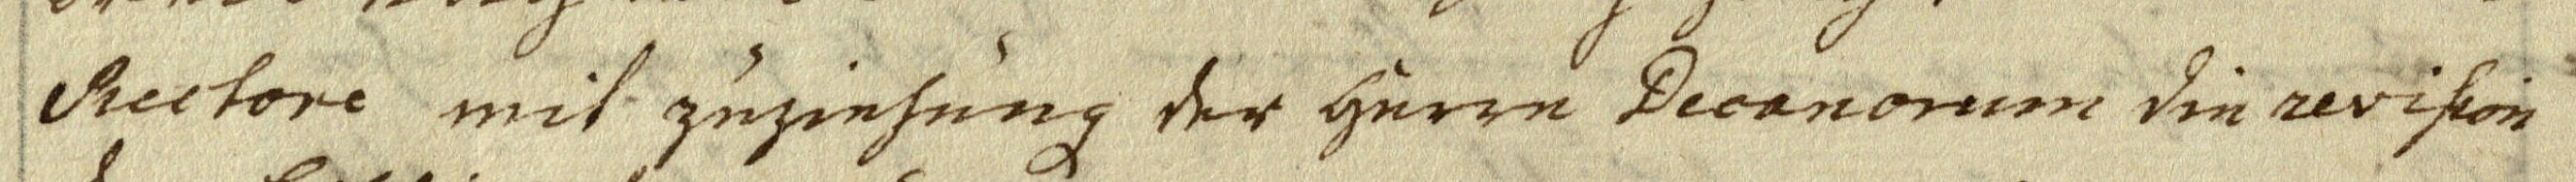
Rectore mit zuziehung der Herrn Decanorum die revision
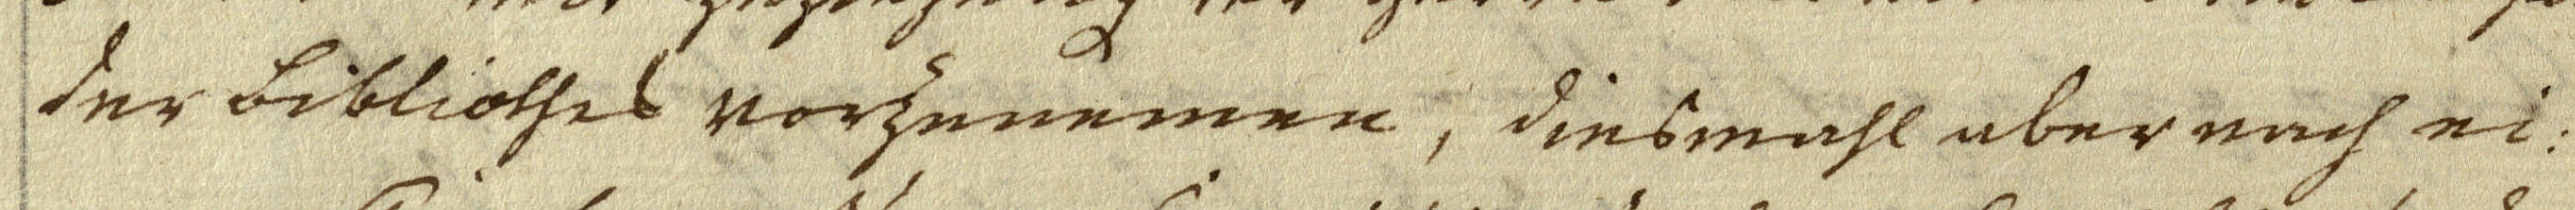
der Bibliothek vorzunemen, diesmahl aber nach ei¬
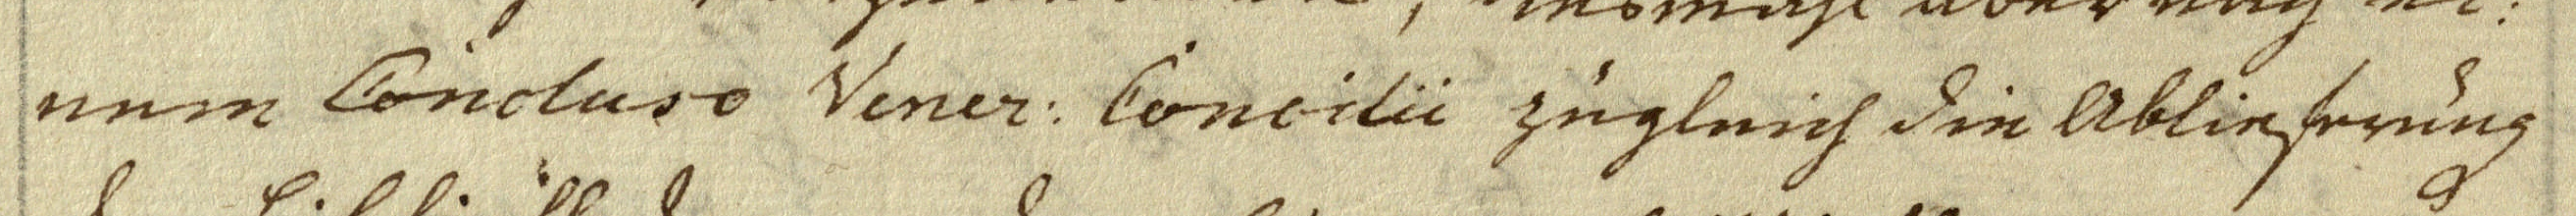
nem Concluso Vener: Concilii zugleich die Ablieferung
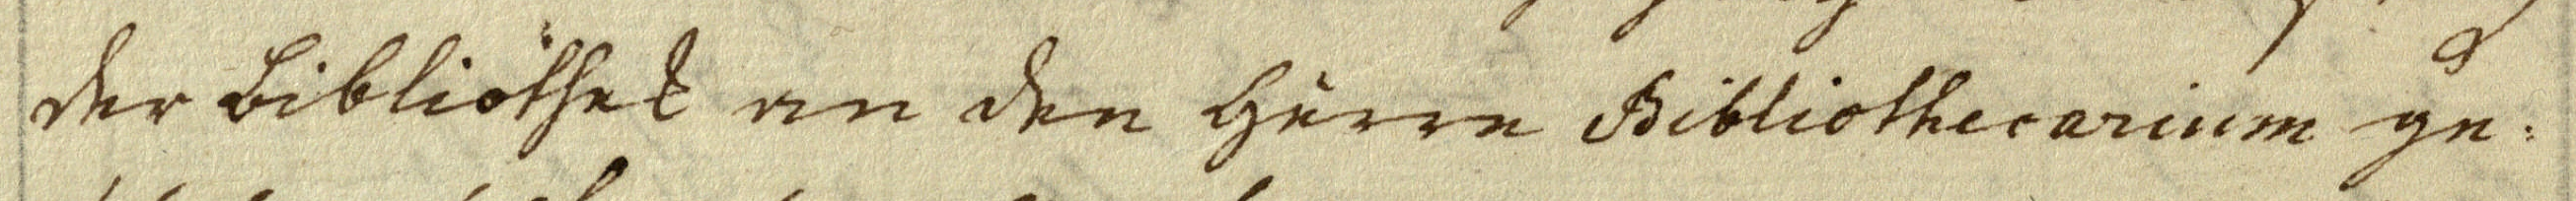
der Bibliothek an den Herrn Bibliothecarium ge¬
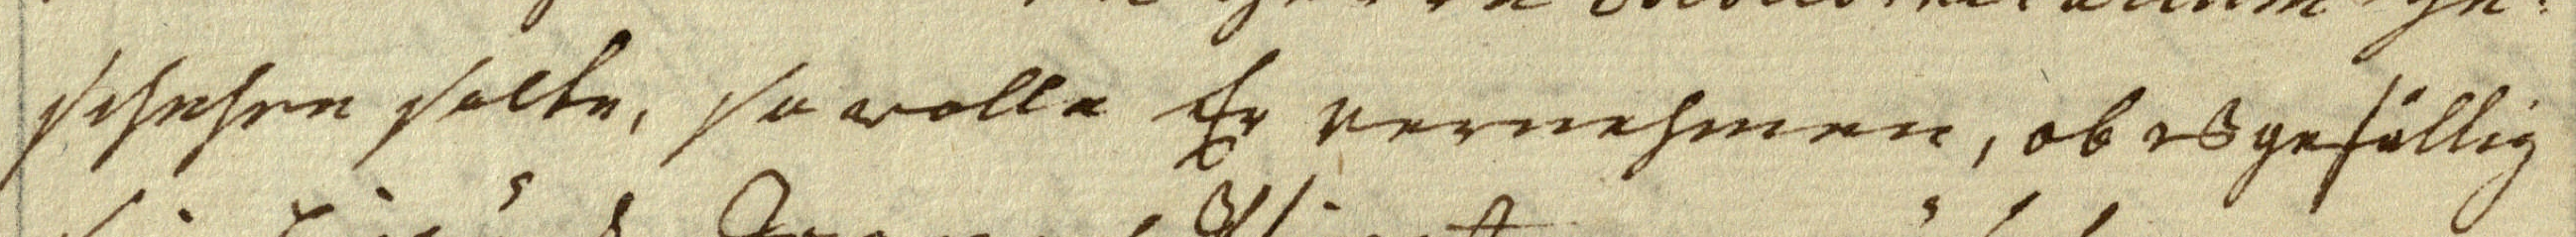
schehen solte, so wolle er vernehmen, ob es gefällig
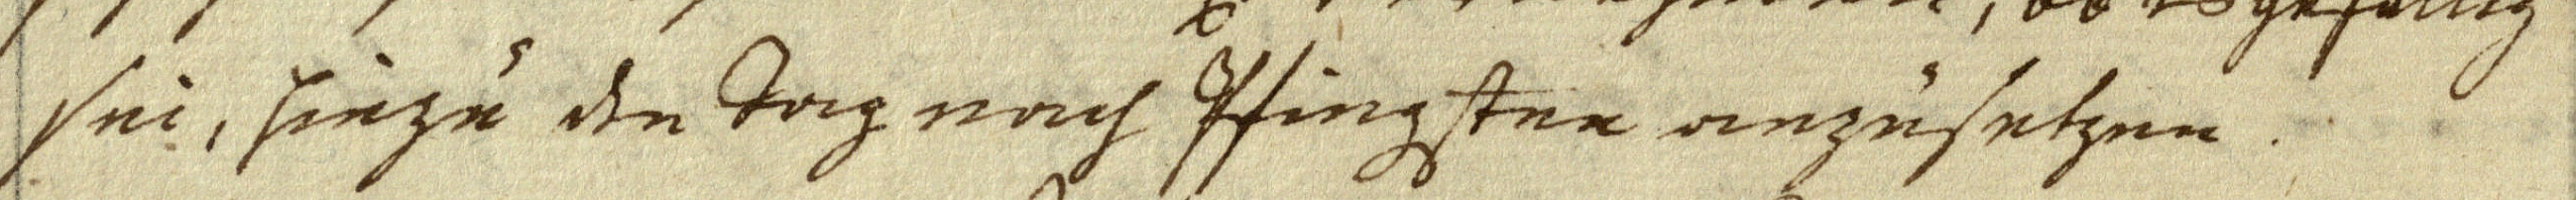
sei, hiezu den Tag nach Pfingsten anzusetzen.
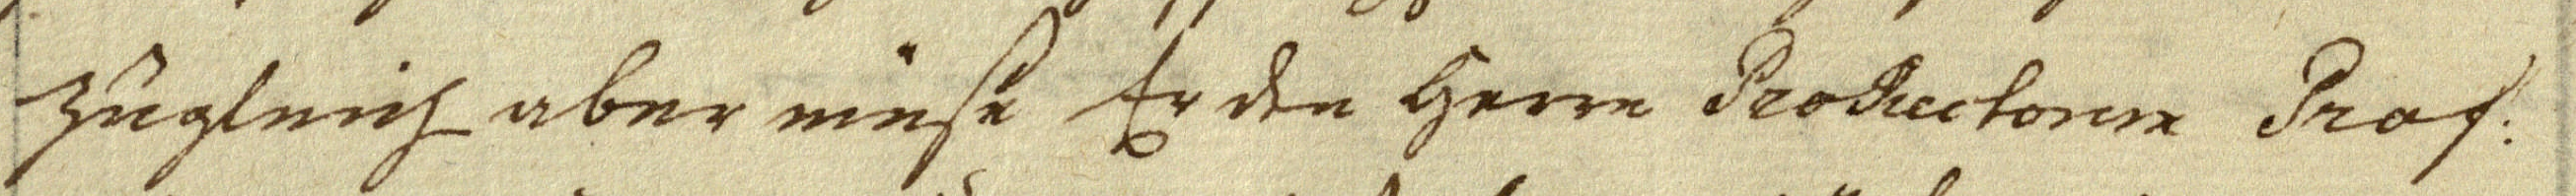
zugleich aber müße Er den Herrn ProRectorem Prof:
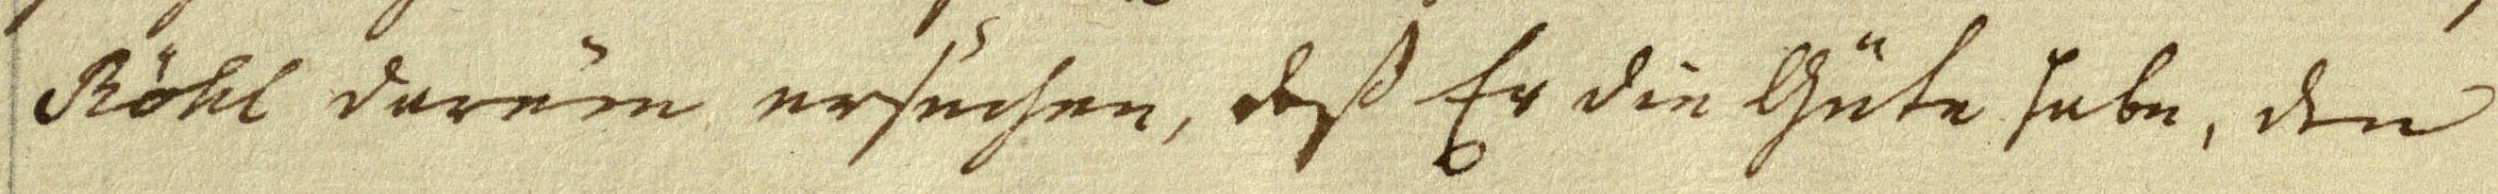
Röhl darum ersuchen, daß Er die Güte habe, den
